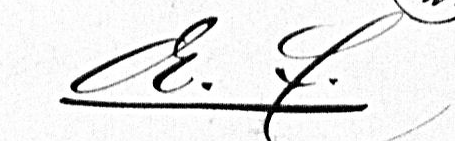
A. E.
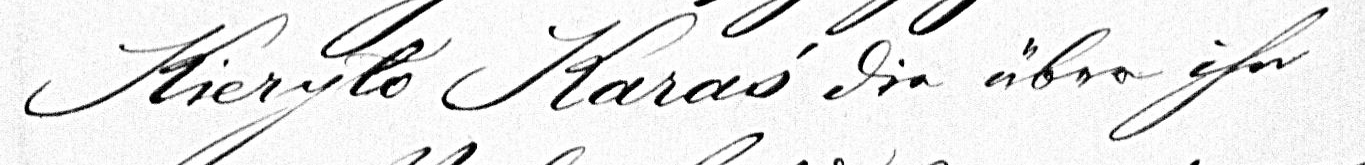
Kieryto Karaś die über ihn
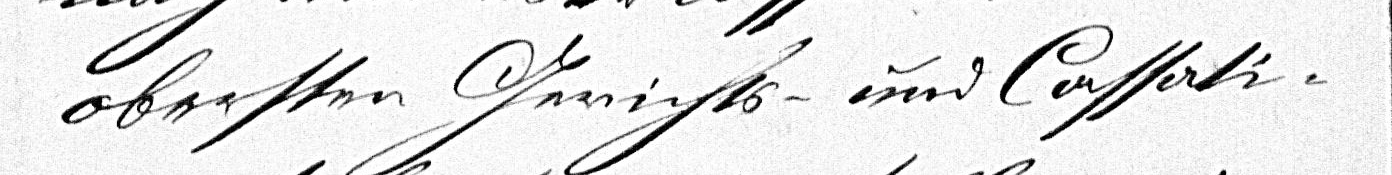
obersten Gerichts- und Cassati¬
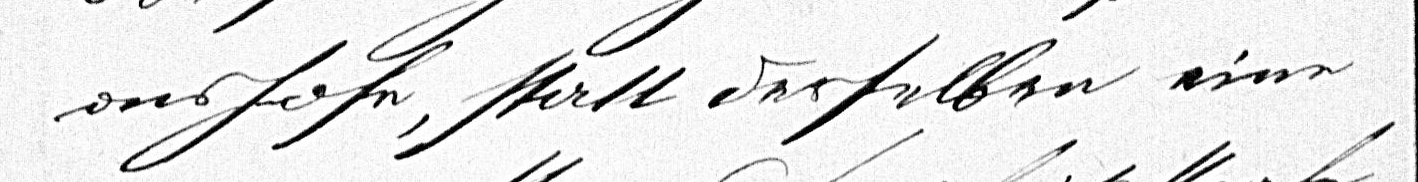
onshofe, statt derselben eine
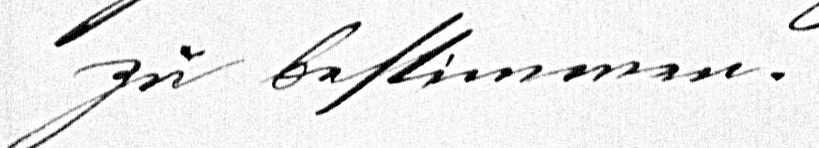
zu bestimmen.
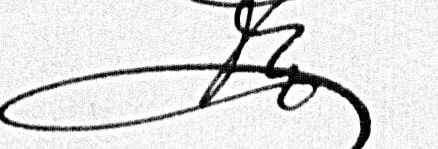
xx
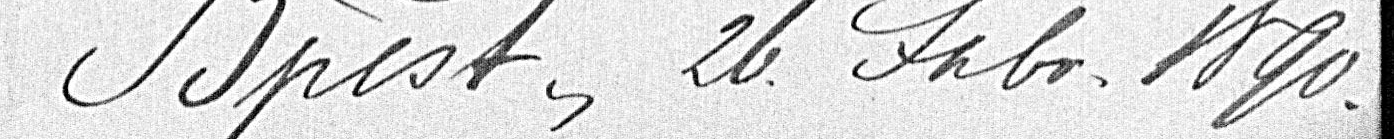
Bpest, 26. Febr. 1890.
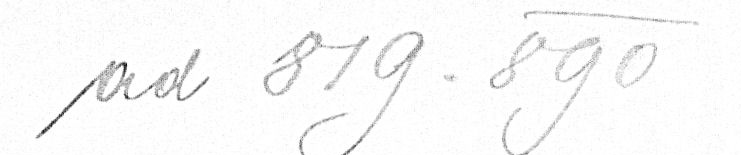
ad 819.890
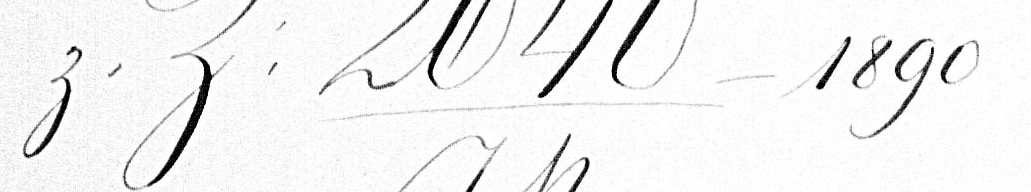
z.Z: 2640 - 1890
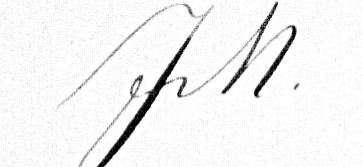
Jh.
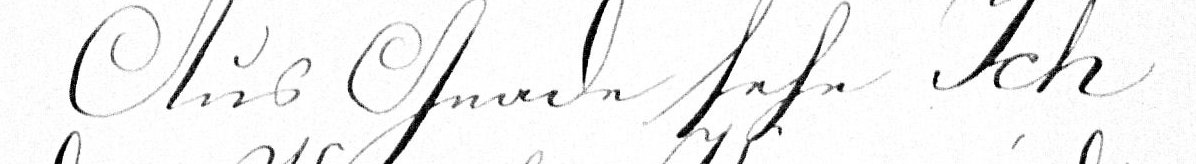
Aus Gnade sehe Ich
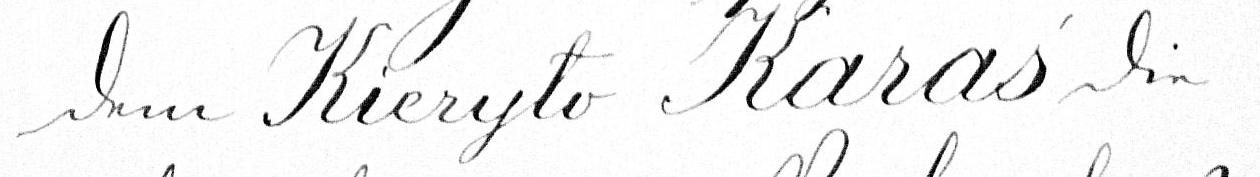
dem Kieryto Karaś die
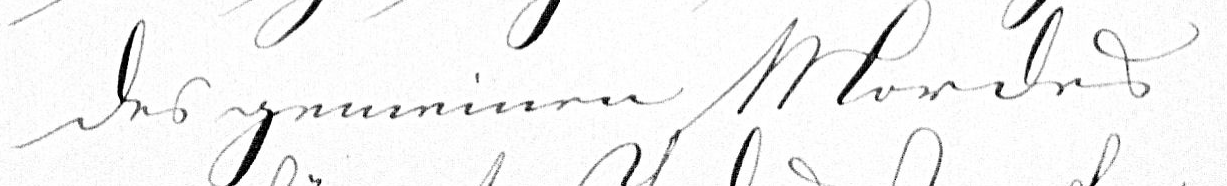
des gemeinen Mordes
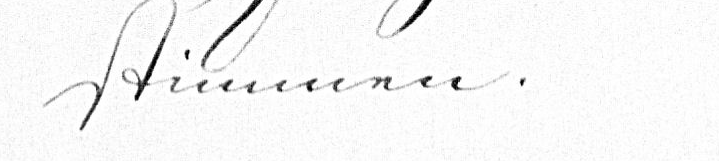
stimmen.
